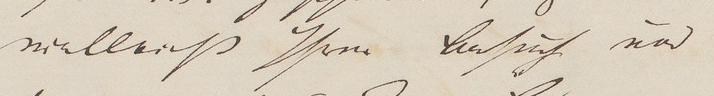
vielleicht Ihren Besuch und
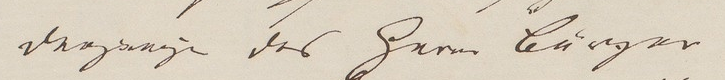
denjenigen des Herrn Bürger-
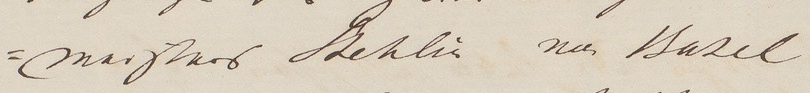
meisters Stehlin von Basel
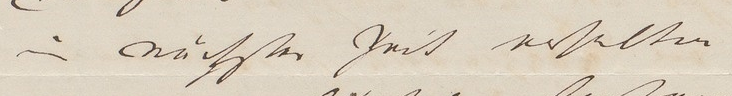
in nächster Zeit erhalten
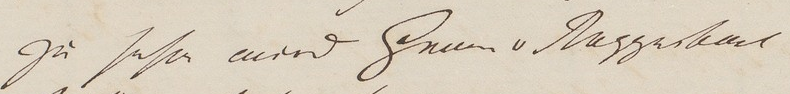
zu sehen wird Herrn v Roggenbach
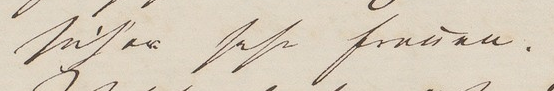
sicher sehr freuen.
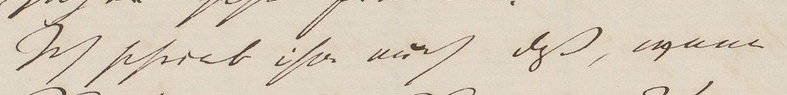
Ich schrieb ihm auch daß, wenn
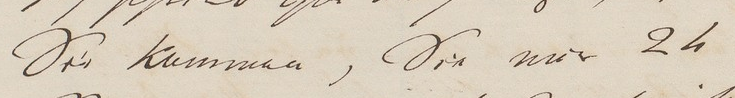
Sie kommen, Sie nur 24
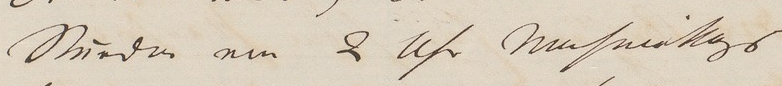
Stunden von 2 Uhr Nachmittags
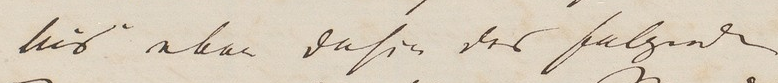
bis eben dahin des folgenden
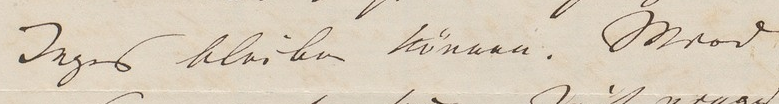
Tages bleiben können. Wird
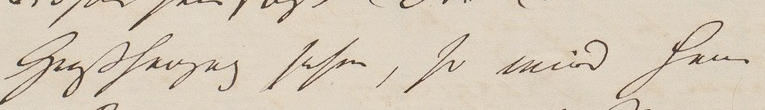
Großherzog sehen, so wird Herr
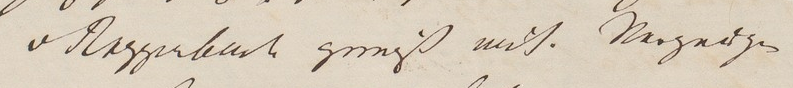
v Roggenbach gewiß mit Vergnügen
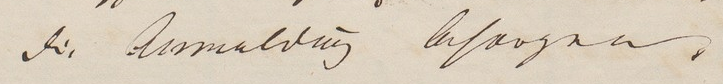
die Anmeldung besorgen.
